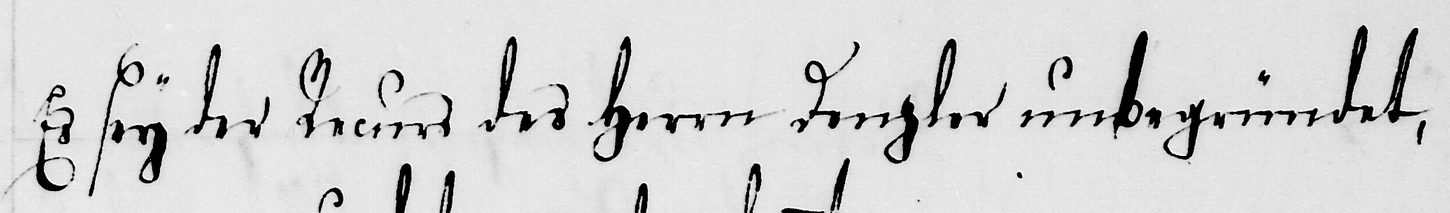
Es sey der Recurs des Herrn Denzler unbegründet,
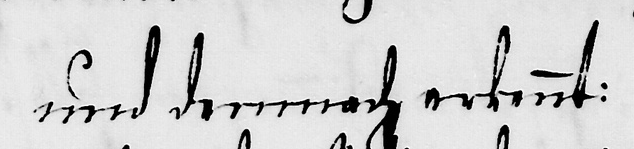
und demnach erkennt:
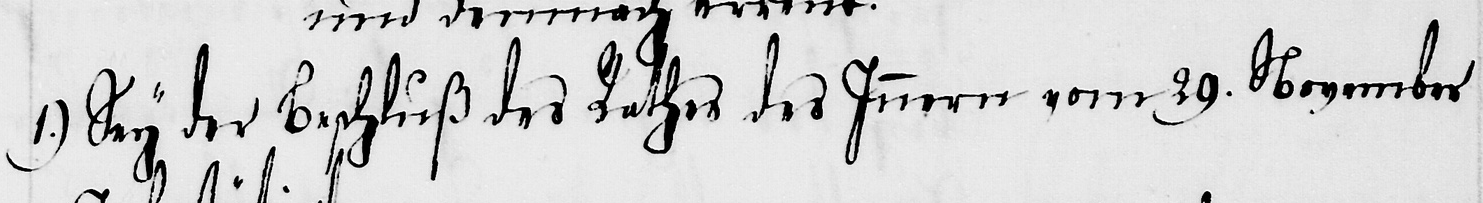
1.) Sey der Beschluß des Rathes des Innern vom 29. November
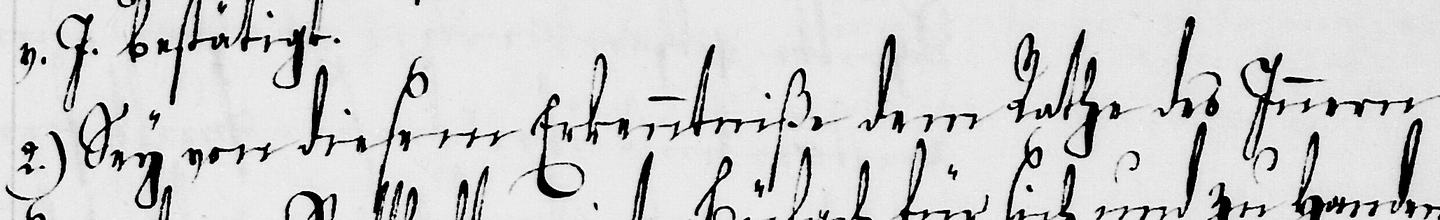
2.) Sey von diesem Erkenntniß dem Rathe des Innern
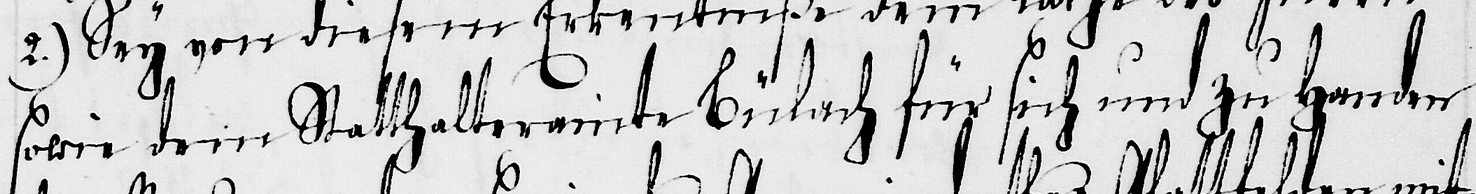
sowie dem Statthalteramte Bülach für sich und zu Handen
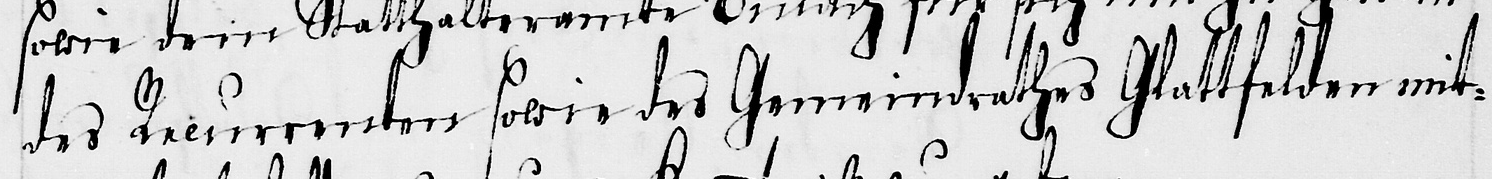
des Recurrenten sowie des Gemeindrathes Glattfelden mit¬
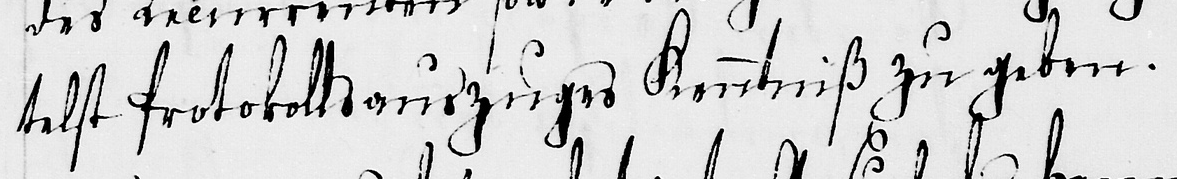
telst Protokollsauszuges Kenntniß zu geben.
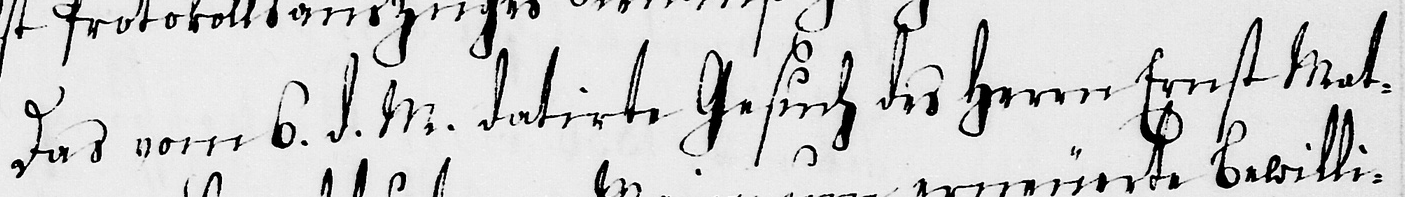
Das vom 6. d. M. datirte Gesuch des Herrn Ernst Mat¬
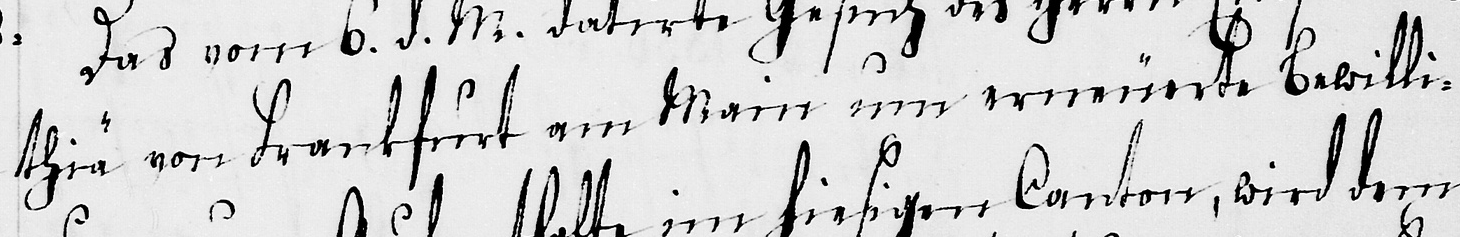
thiä von Frankfurt am Main um erneuerte Bewilli¬
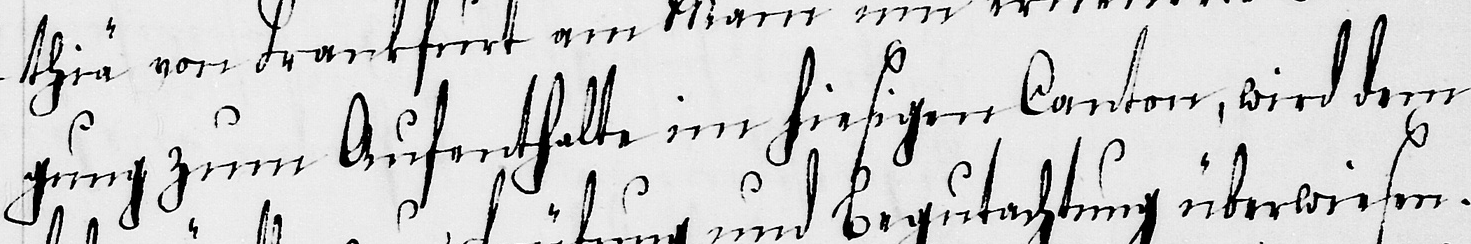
gung zum Aufenthalte im hiesigen Canton, wird dem
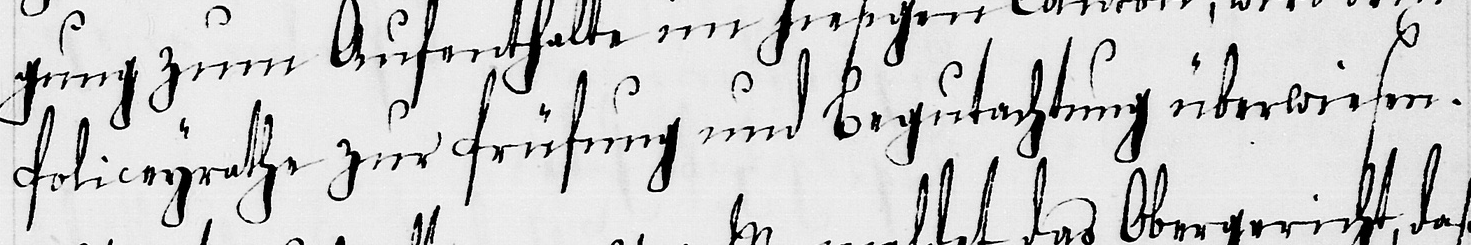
Policeyrathe zur Prüfung und Begutachtung überwiesen.
